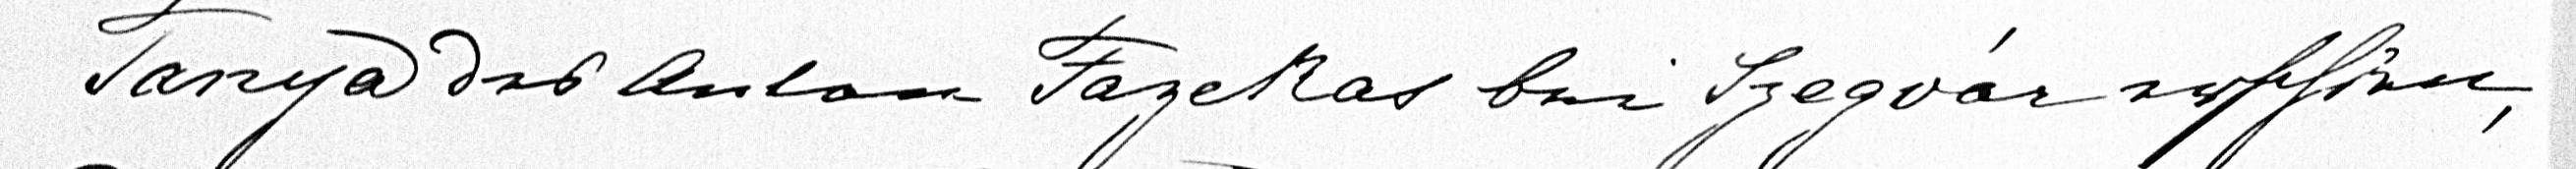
Tanya des Anton Fazekas bei Szegvár erschien,
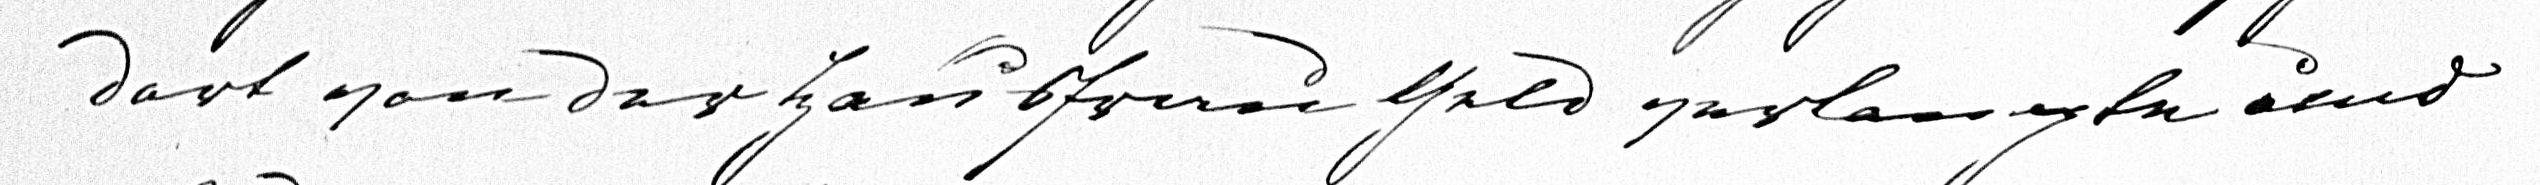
dort von der Hausfrau Geld vorlangte und
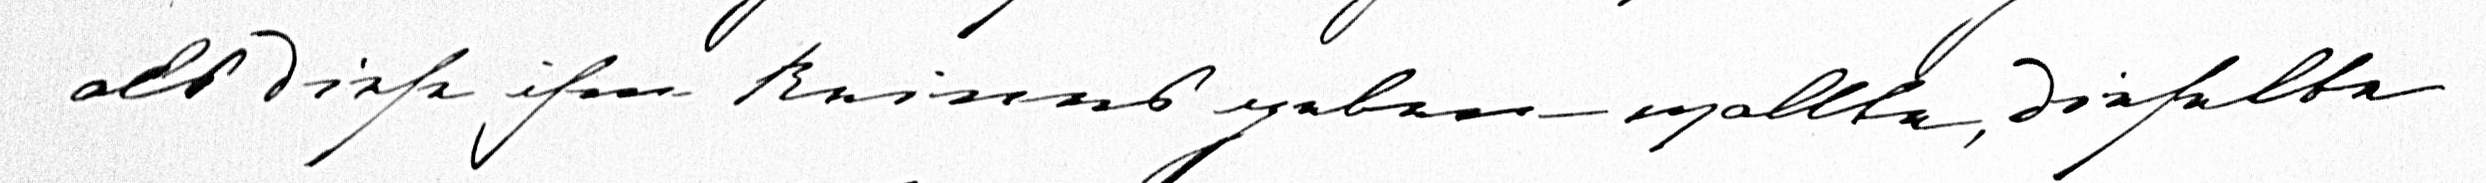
als diese ihm Keines geben wallte, dieselte
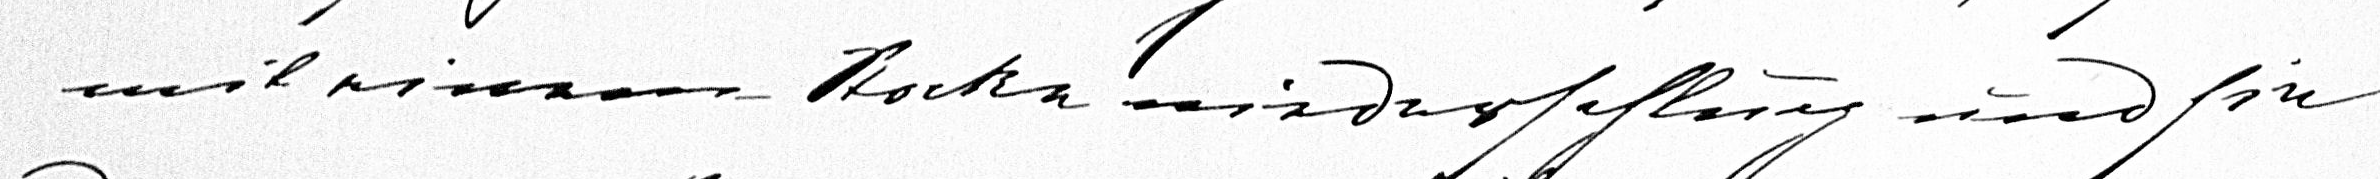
mit einem Stocke niederschlug und sie
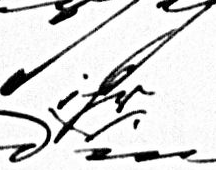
ihr
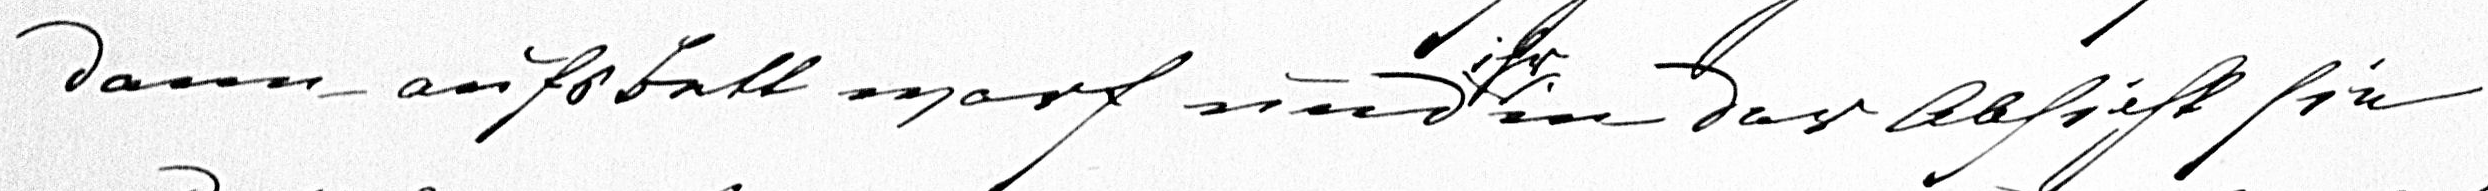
dann aufsbett warf und in dar Absicht sie
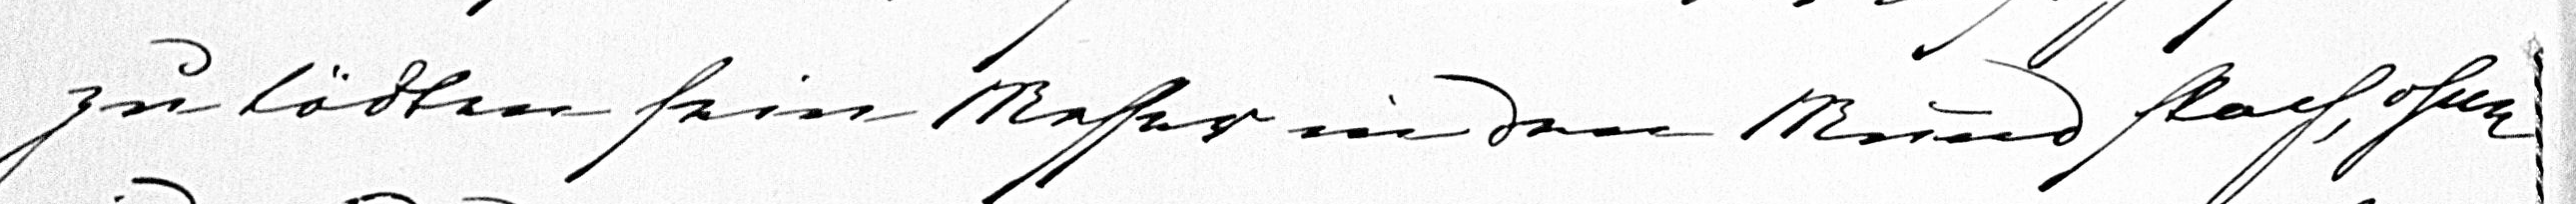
zu tödten sein Messer in den Mund flach, ohne
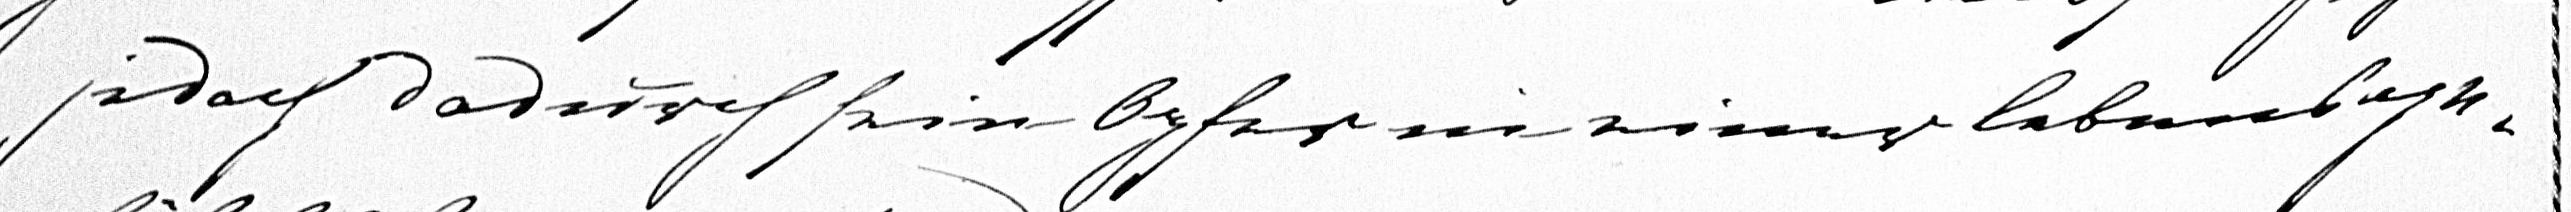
jedoch dadurch sein Opfer in einer lebensge¬
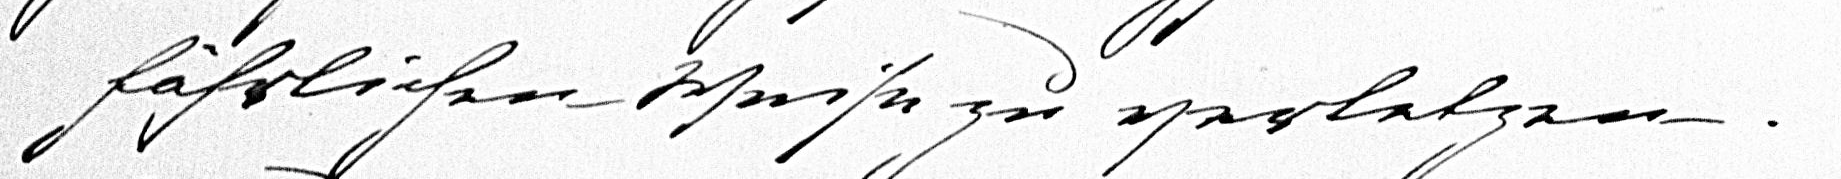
fährlichen Weise zu verletzen.
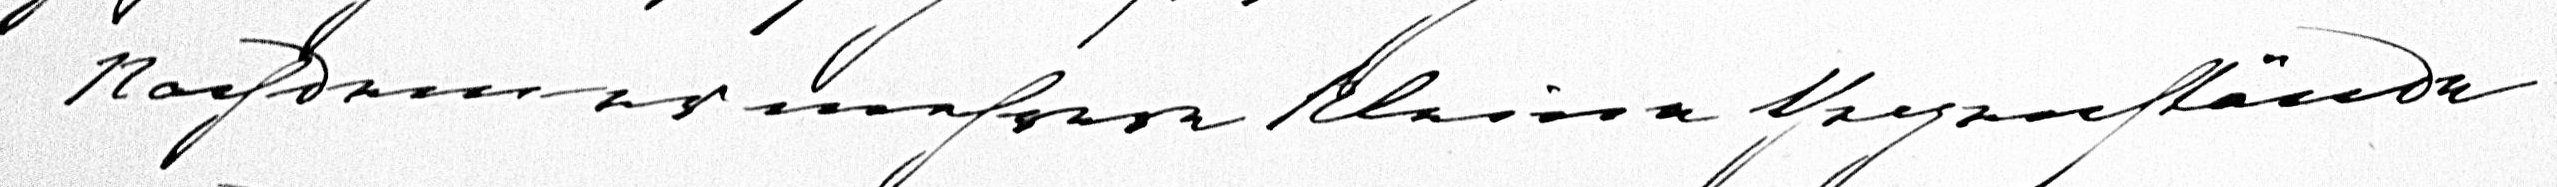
Nachdem er mehrere Kleine Gegenstände
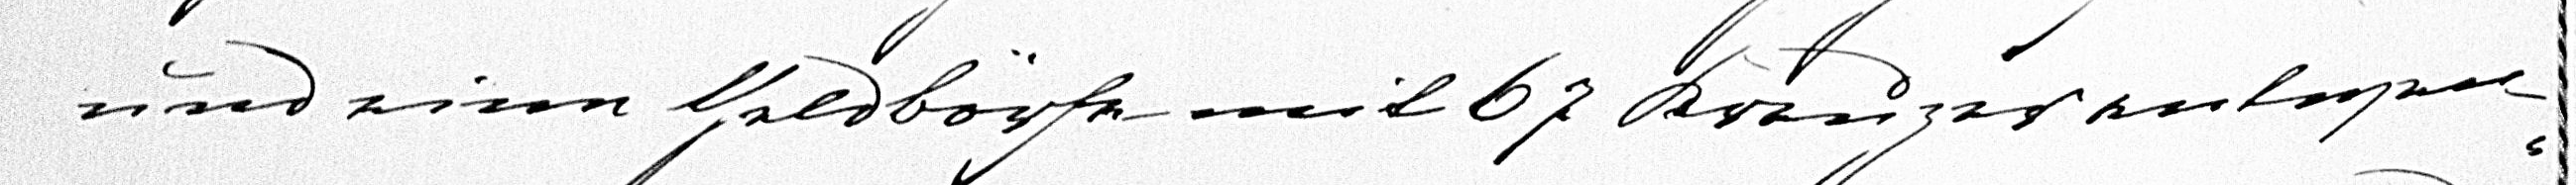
und eine Geldbörse mit 67 Kreuzerentwen¬
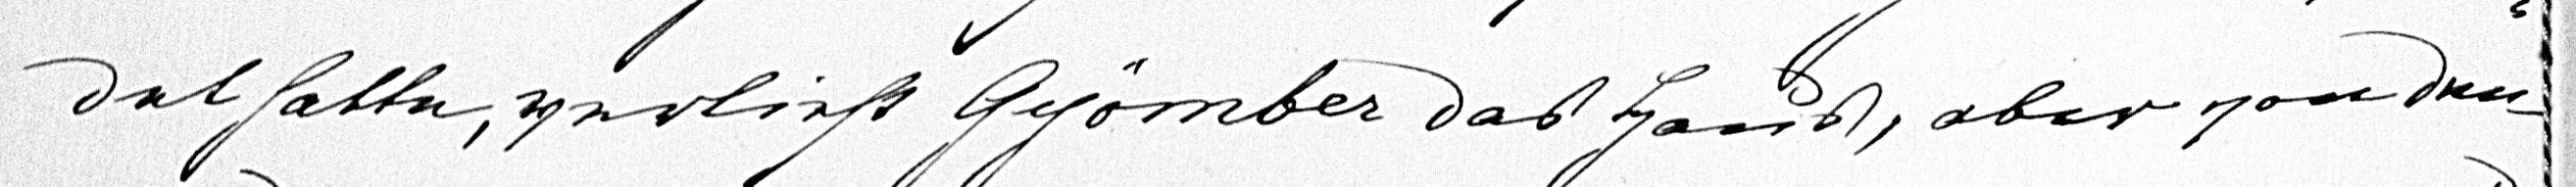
det hatte, verließ Gyömber das Haus, aber von den
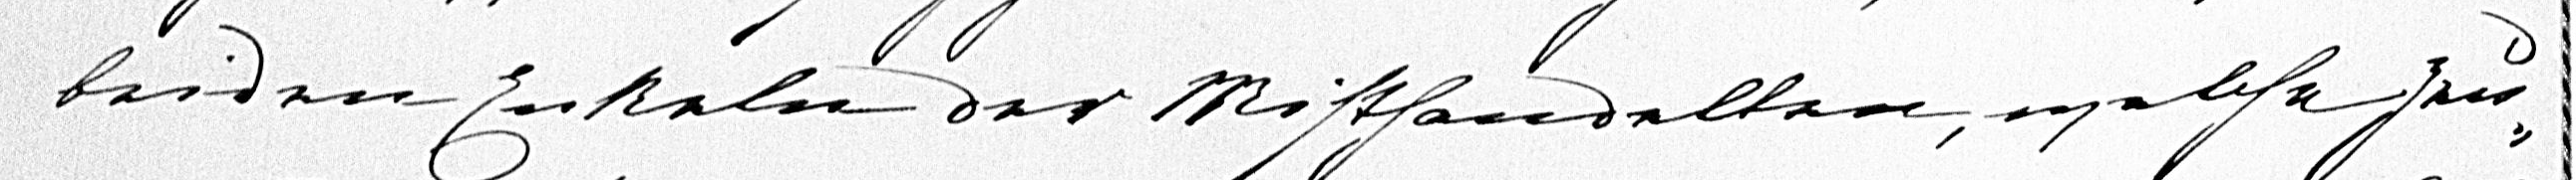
beiden Enkeln der Misthandelten, welche zeu¬
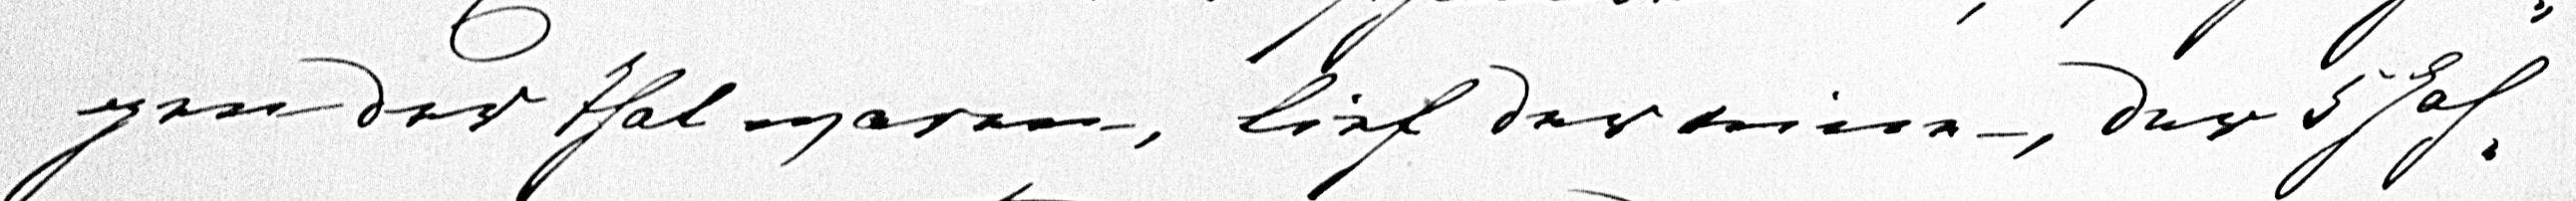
gen der Thal waren, lief der eine, der 5 Jah¬
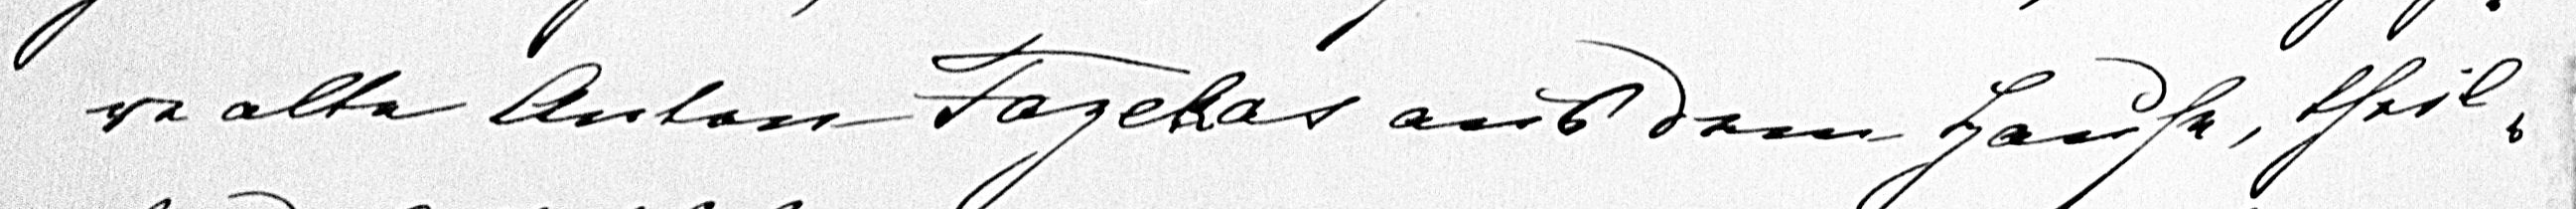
re alte Anton Fazekas aus dem Hause, theil¬
